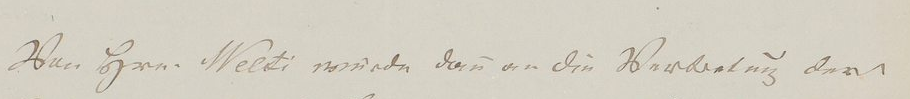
Von Hrn. Welti wurde dann an die Vetretung der
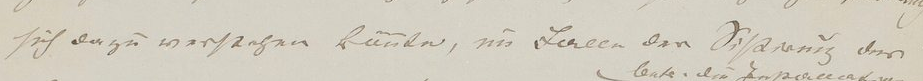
sich dazu verstehen könnte, im Falle der Sistirung des
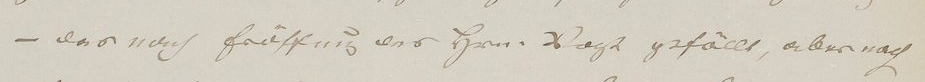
– das nach Eröffnung des Hrn. Vogt gefällt, aber noch
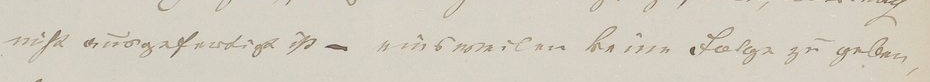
nicht ausgefertigt ist – einsweilen keine Folge zu geben,
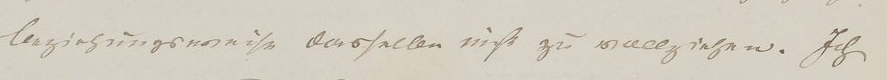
beziehungsweise dasselbe nicht zu vollziehen. Ich
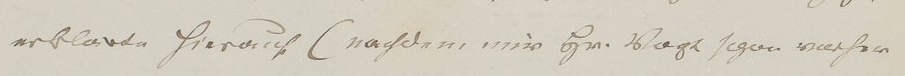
erklärte hierauf (nachdem mir Hr. Vogt schon vorher
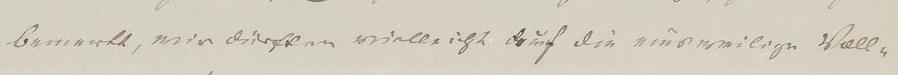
bemerkt, wir dürften vielleicht auf die einsweilige Voll-
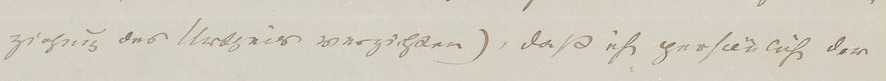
ziehung des Urtheils verzichten), daß ich persönlich der
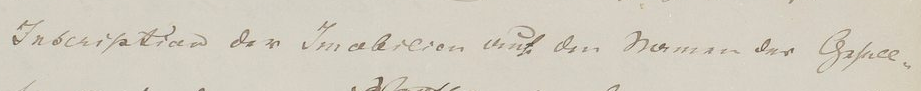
Inscription der Imobilien auf den Namen der Gesell-
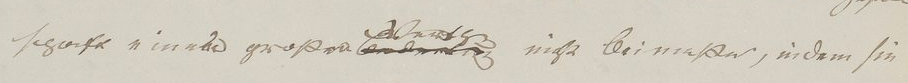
schaft einen großen BedeutungWerth nicht beimeße, indem sie
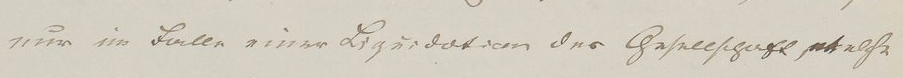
nur im Falle einer Liquidation der Gesellschaft, welche
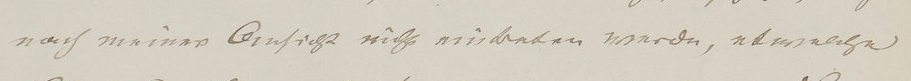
nach meiner Ansicht nicht eintreten werde, etwelche
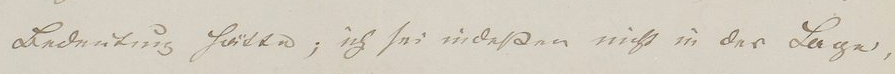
Bedeutung hätte; ich sei indeßen nicht in der Lage
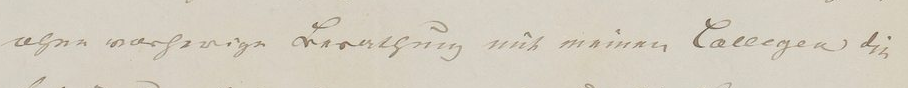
ohne vorherige Berathung mit meinen Collegen die
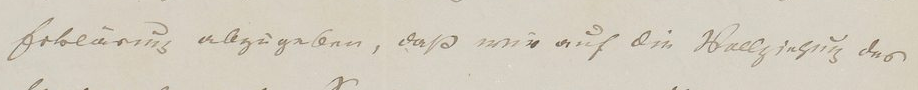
Erklärung abzugeben, daß wir auf die Vollziehung des
